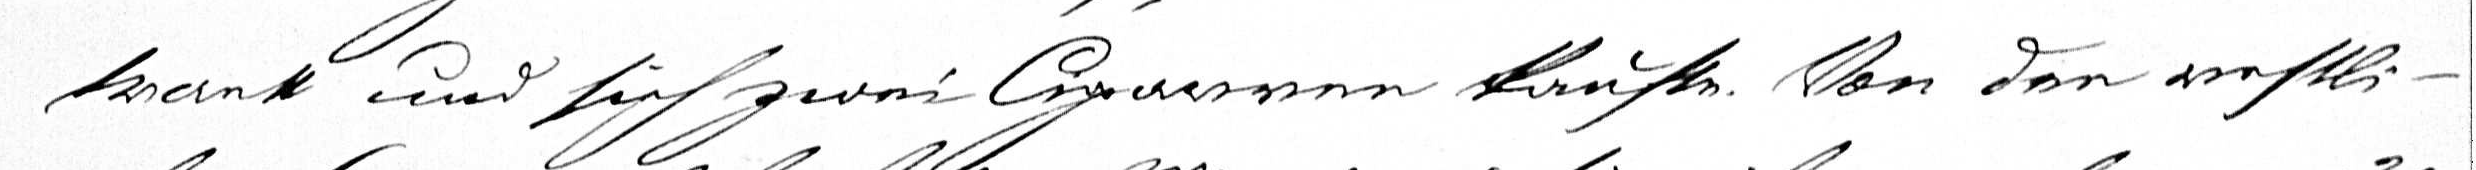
trank und sich zwei Cigarren kaufte. Von den restli¬
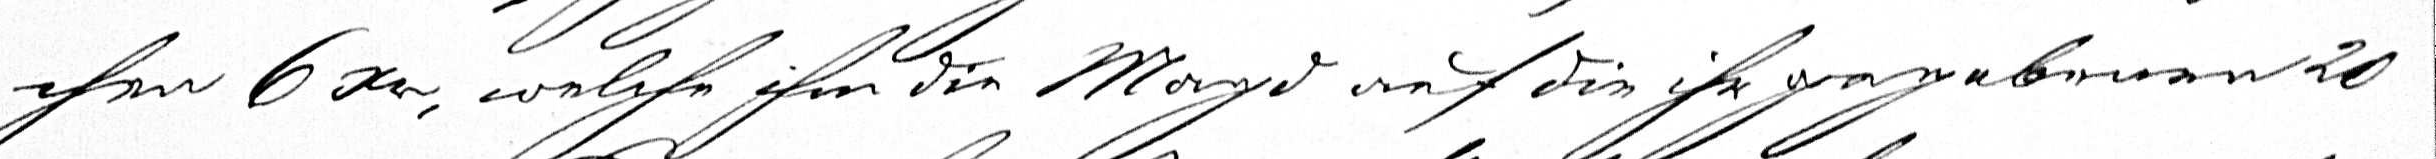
chen 6 Kr, welche ihm die Magd auf die ihr gegebenen 20
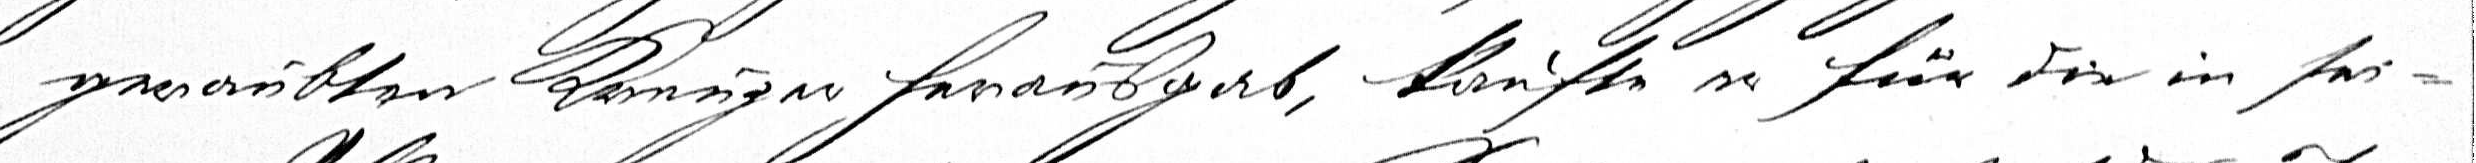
geraubten Kreuzer heraus gab, kaufte er für die in sei¬
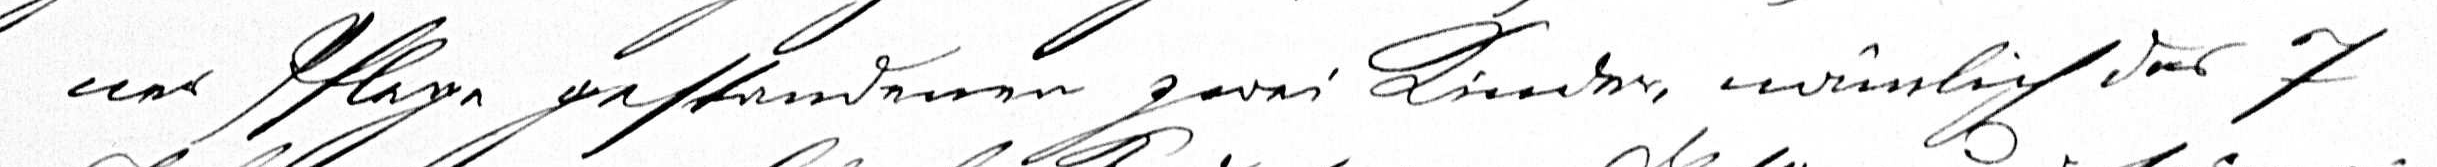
ner Pflege gestandenen zwei Kinder, nämlich des 7
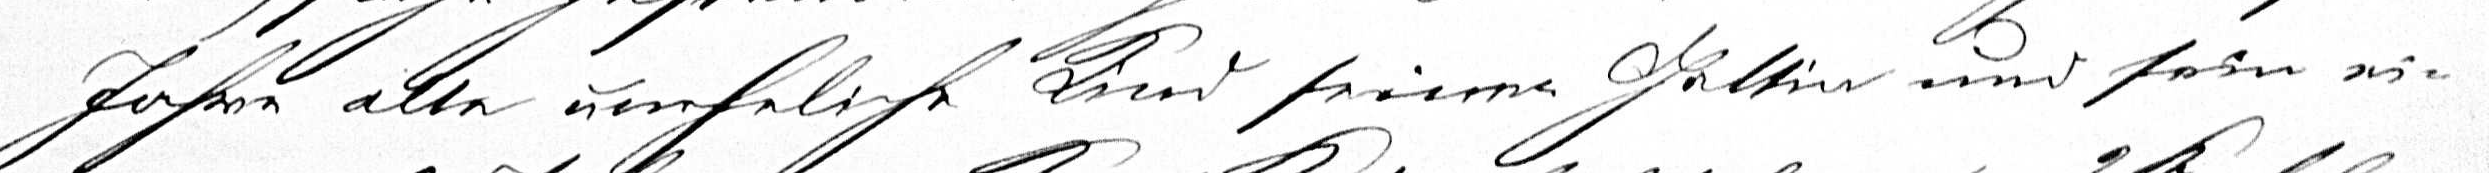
Jahre alte uneheliche Kind seiner Gattin und sein ei¬
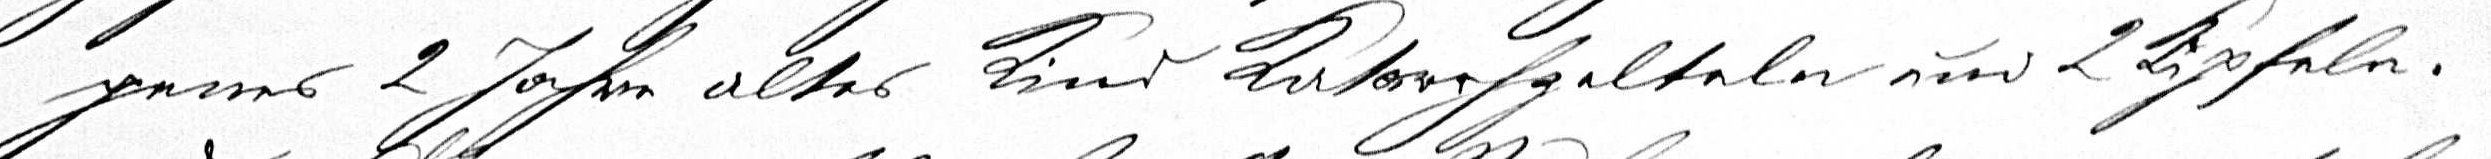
genes 2 Jahre altes Kind Katarrhzelteln und 2 Kipfeln.
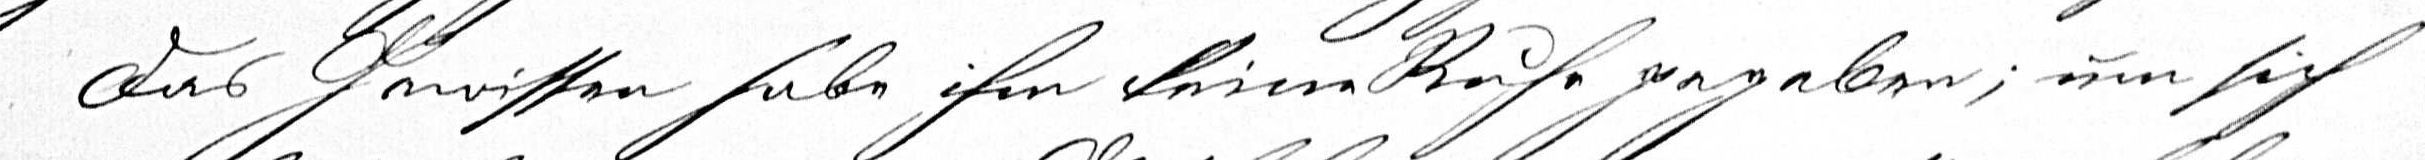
Aus Gewissen habe ihm keine Ruhe gegeben; um sich
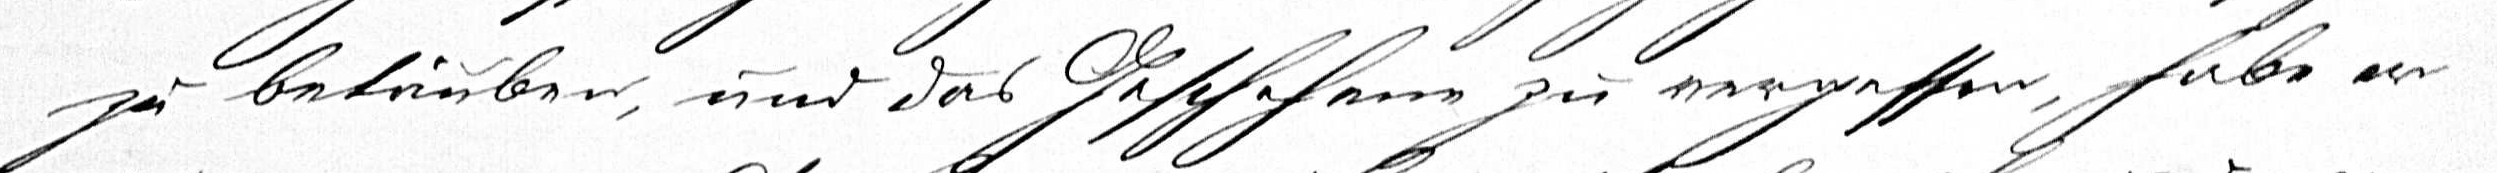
zu betrüben, und das Geschehene zu vergessen, habe er
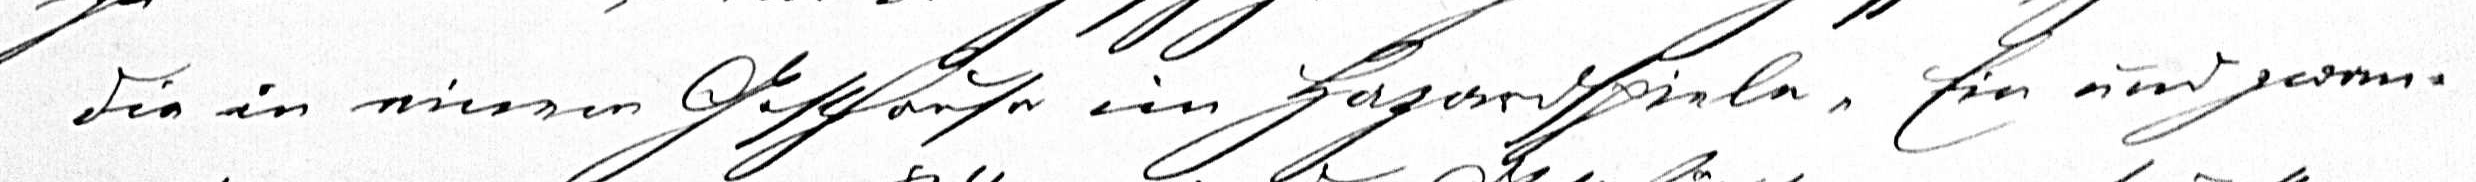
die in einem Gasthause im Hazardspiele „Ein und zwan¬
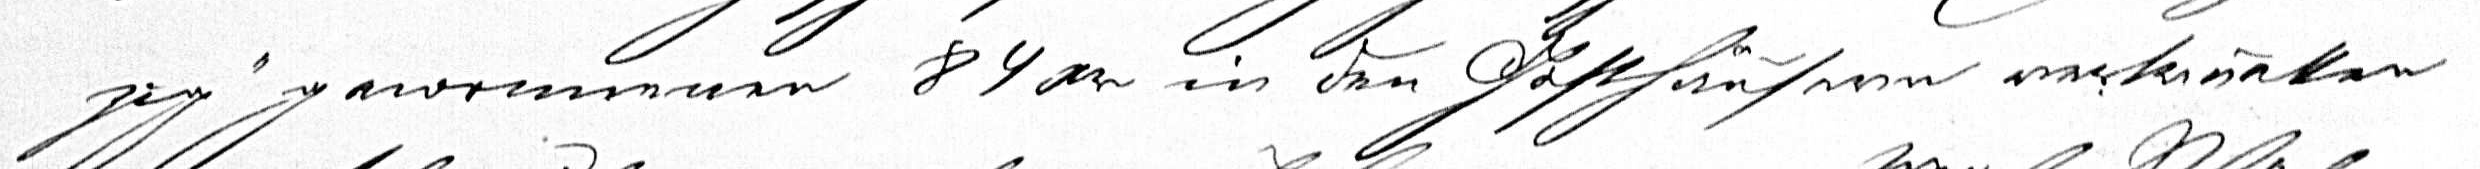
zig“ gewonnenen 84 xr in den Gasthäusern verktrunken
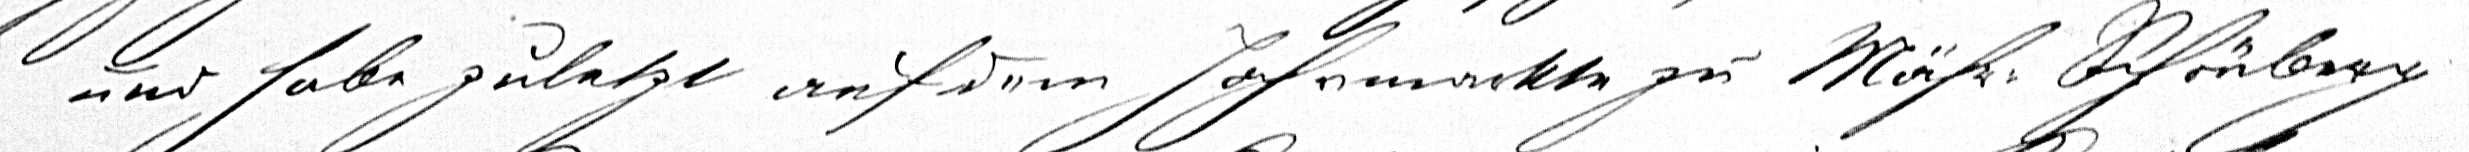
und habe zuletzt auf dem Jahmarkte zu Mähr. Schönberg
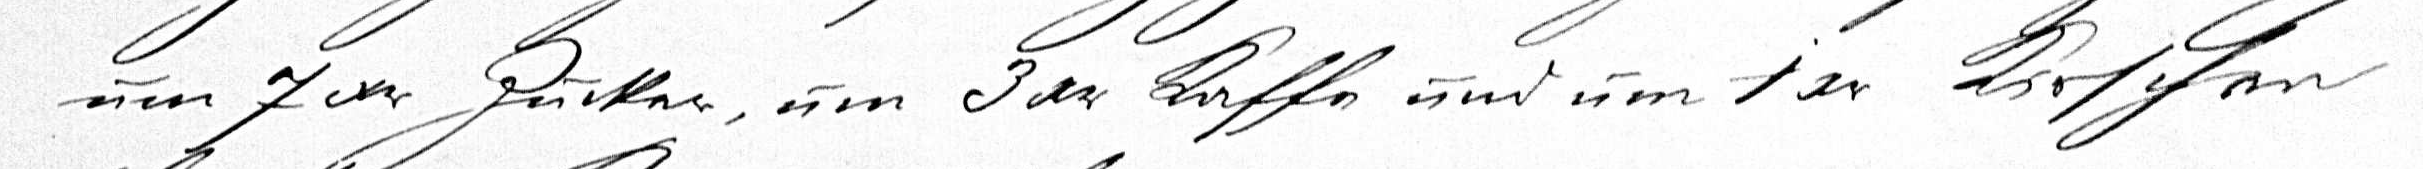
um 7xr Zucker, um 3 xr Kaffe und um 1 xr Kirschen
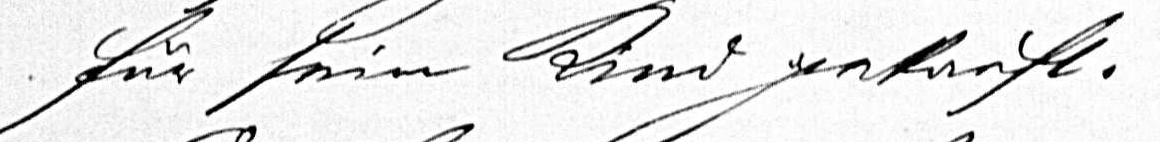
für sein Kind gekauft.
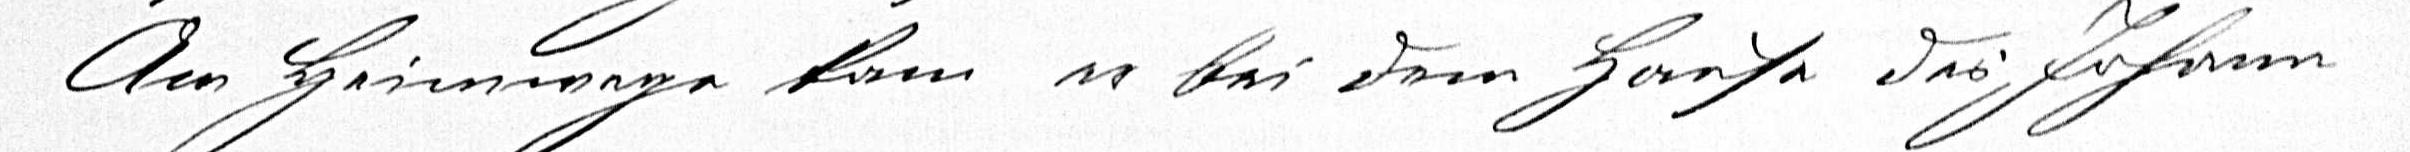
Am Heimwege kam er bei dem Hause des Johann
